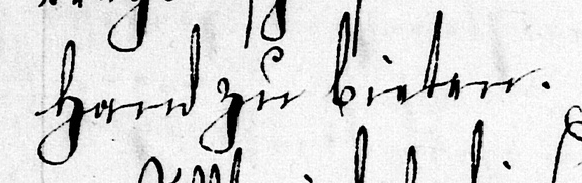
Hand zu bieten.
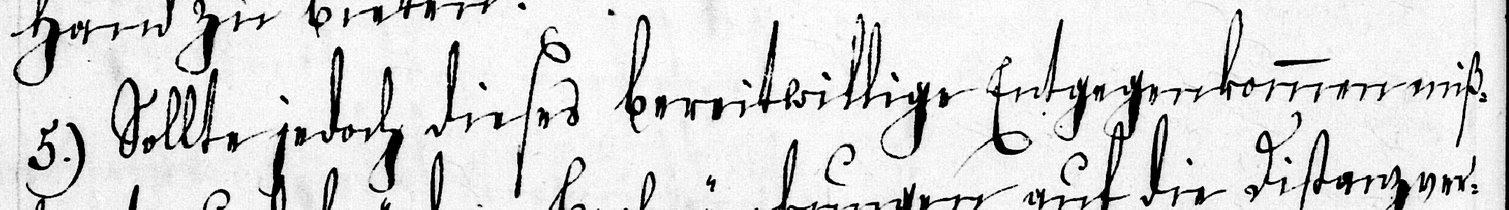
5.) Sollte jedoch dieses bereitwillige Entgegenkommen miß¬
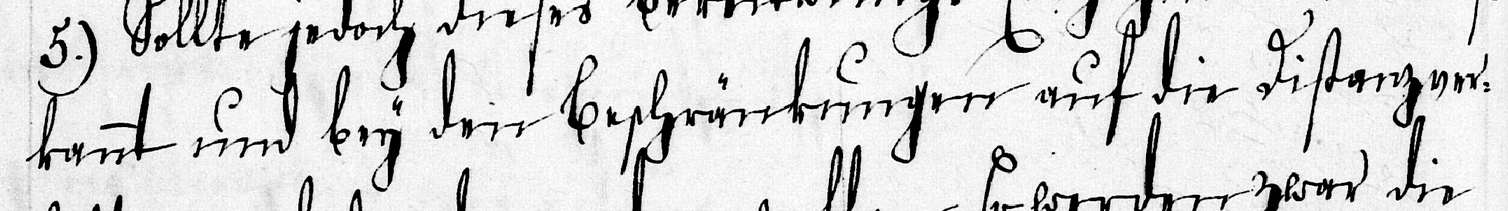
kannt und bey den Beschränkungen auf die Distanzver¬
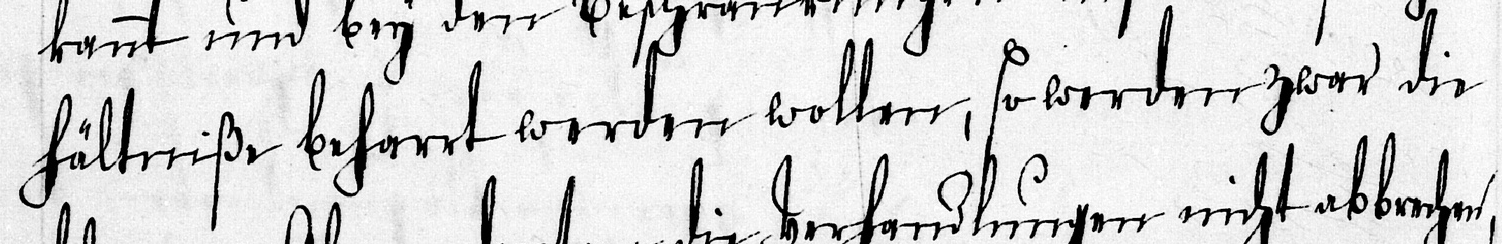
hältniße beharrt werden wollen, so werden zwar die
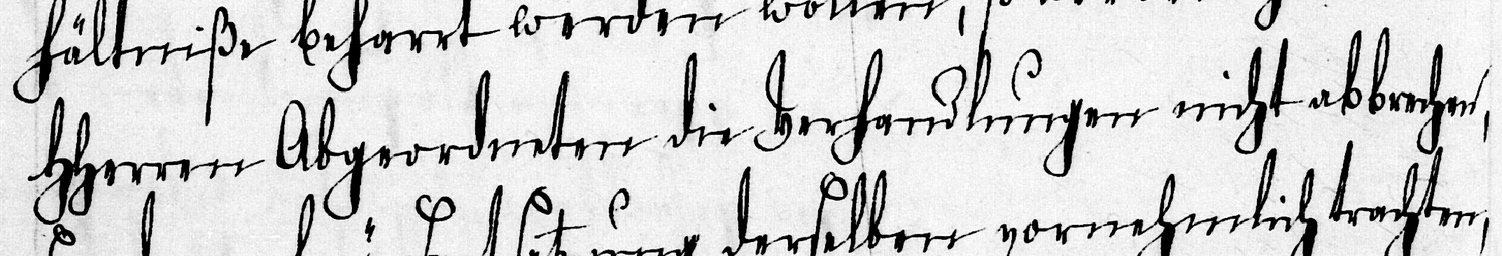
HHerren Abgeordneten die Verhandlungen nicht abbrech¬
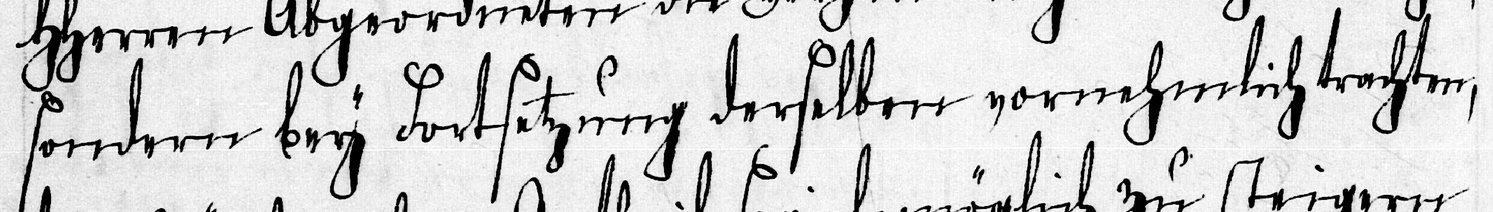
sondern bey Fortsetzung derselben vornehmlich trachte¬
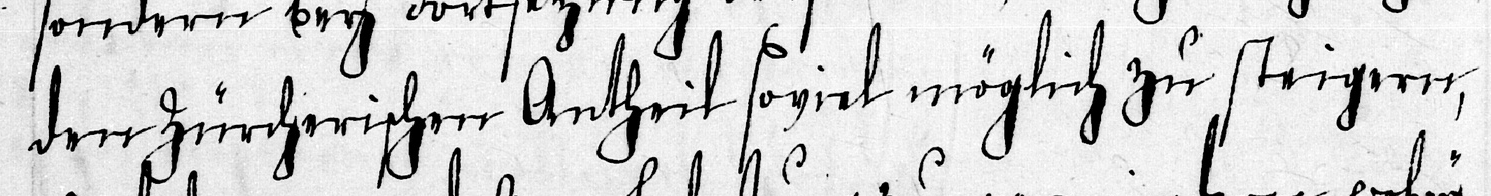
den Zürcherischen Antheil soviel möglich zu steigern,
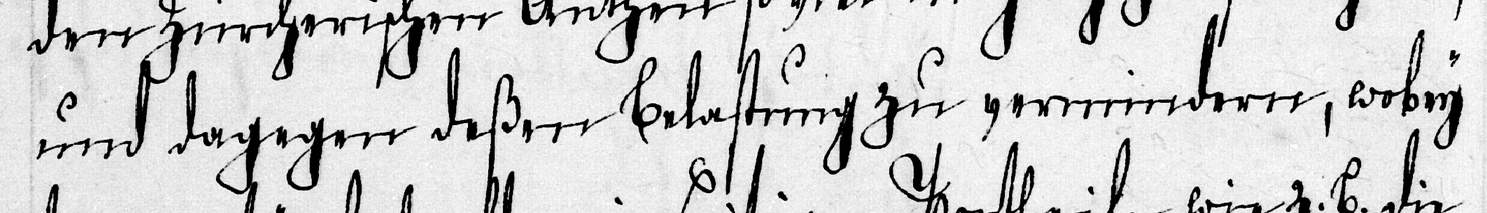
und dagegen deßen Belastung zu vermindern, wobey
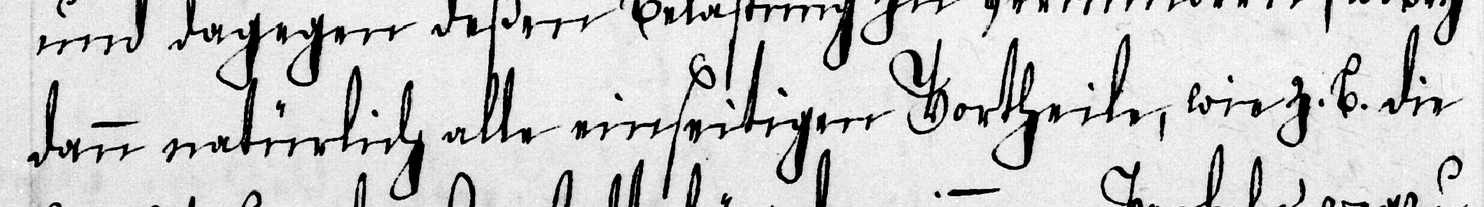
dann natürlich alle einseitigen Vortheile, wie z.B. die
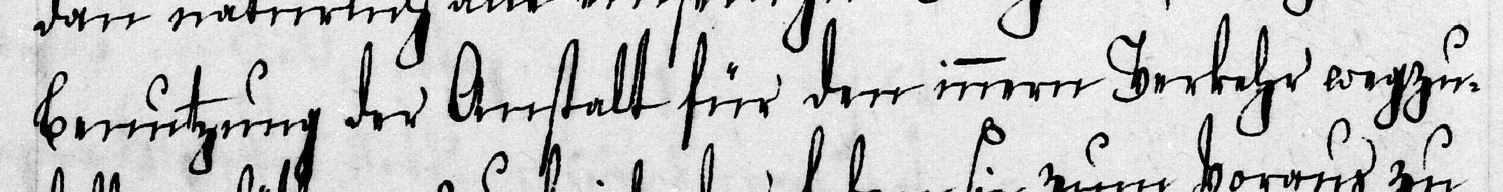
Benutzung der Anstalt für den innern Verkehr wegzu¬
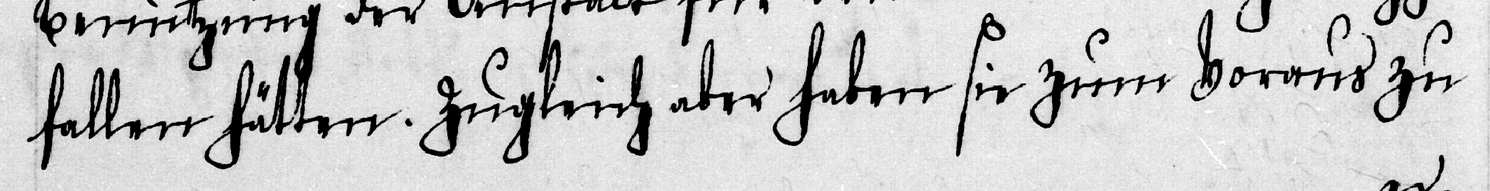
fallen hätten. Zugleich aber haben sie zum Voraus zu
